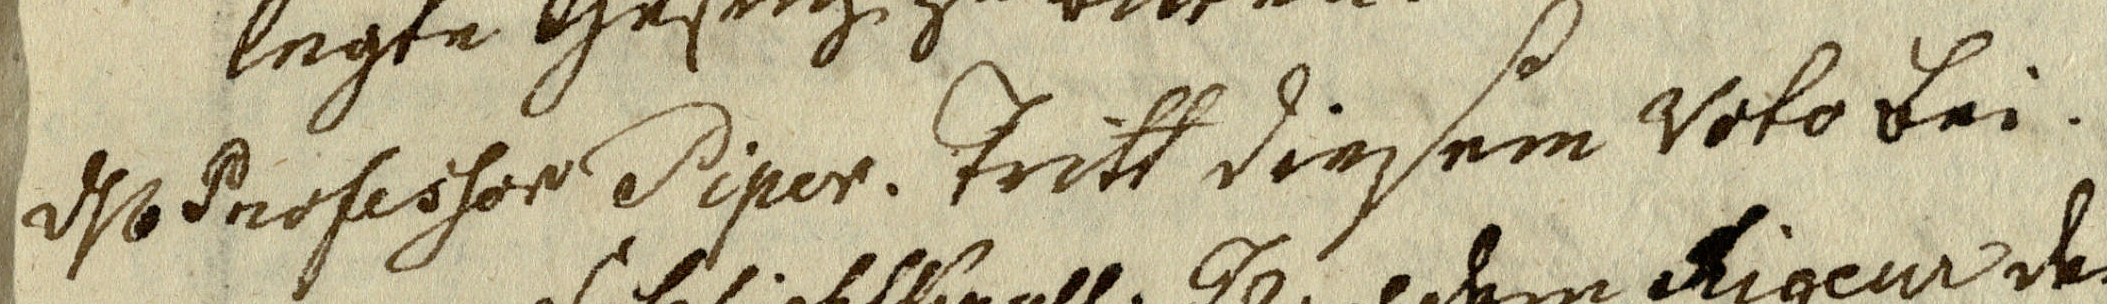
dh. Prof. Piper. Tritt diesem voto bei.
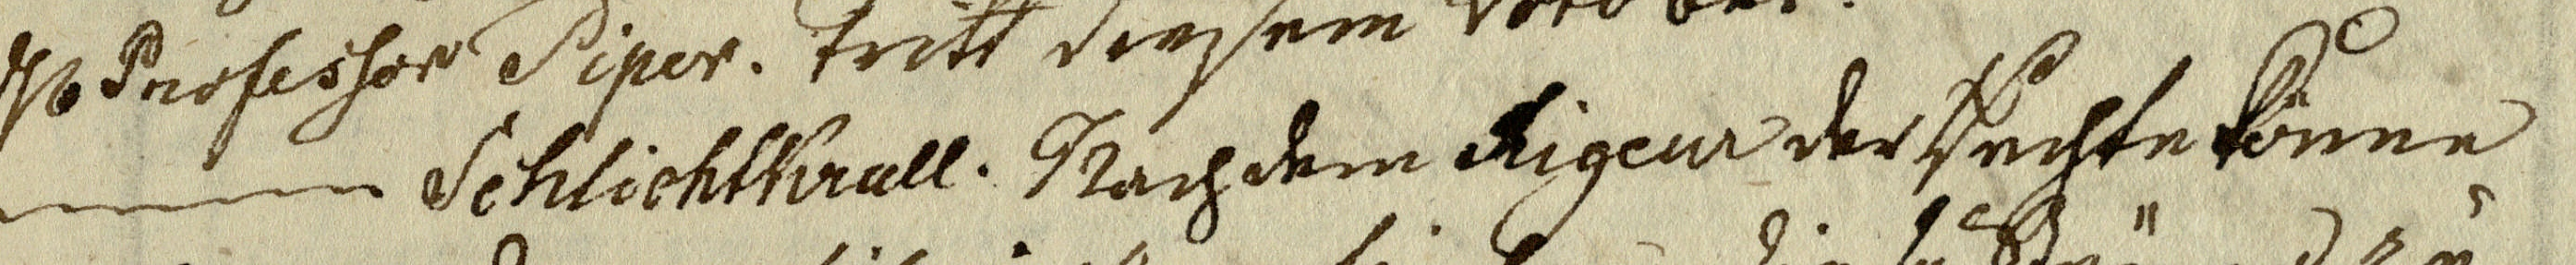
Schlichtkrull. Nach dem Sigeur der Rechte könne
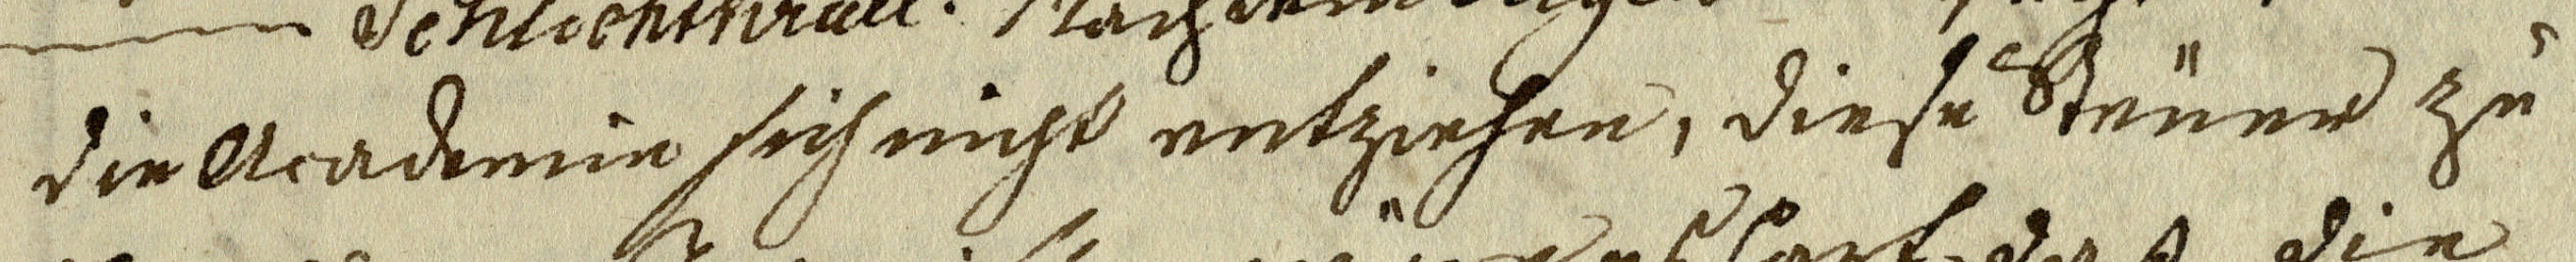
die Academie sich nicht entziehen, diese Steuer zu
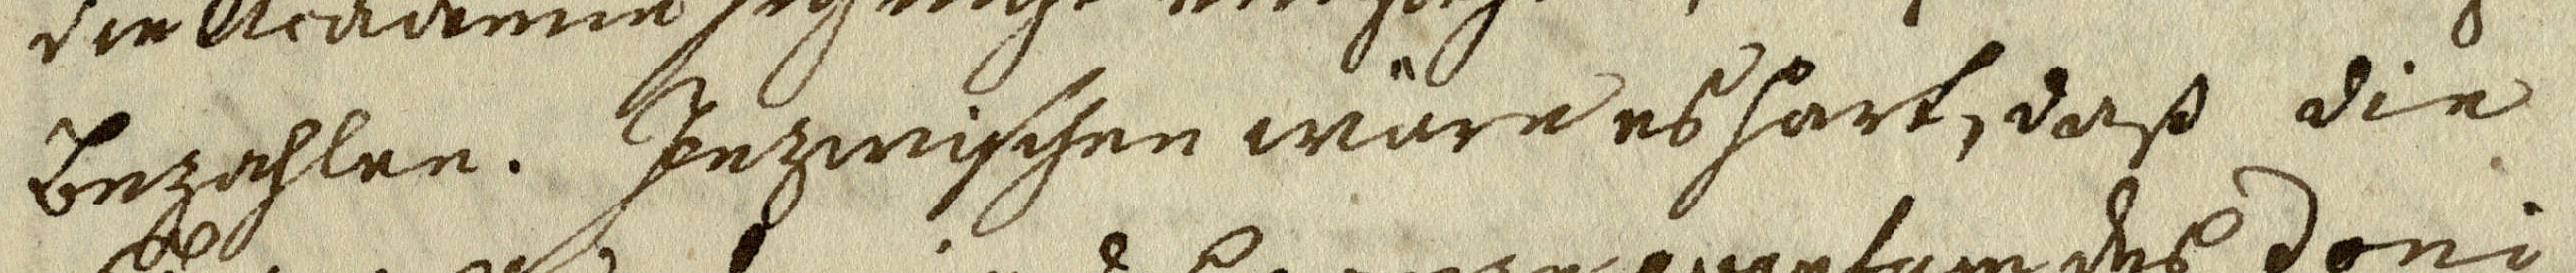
bezahlen. Inzwischen wäre es hart, daß die
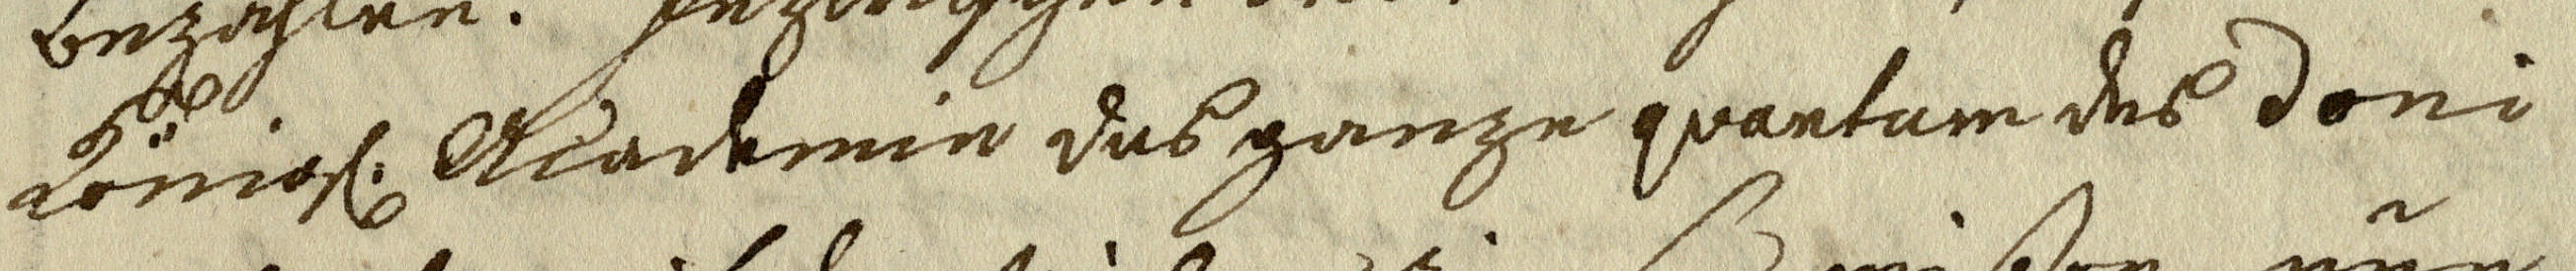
Königl. Academie das ganze quantum des doni
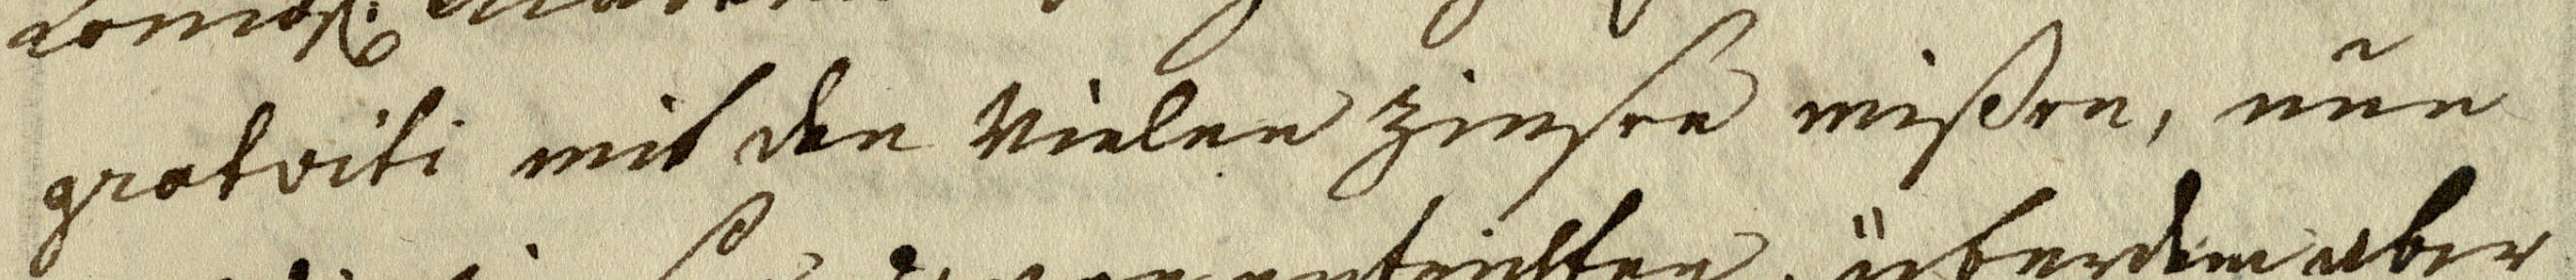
gratuiti mit den vielen Zinsen nießen, nun
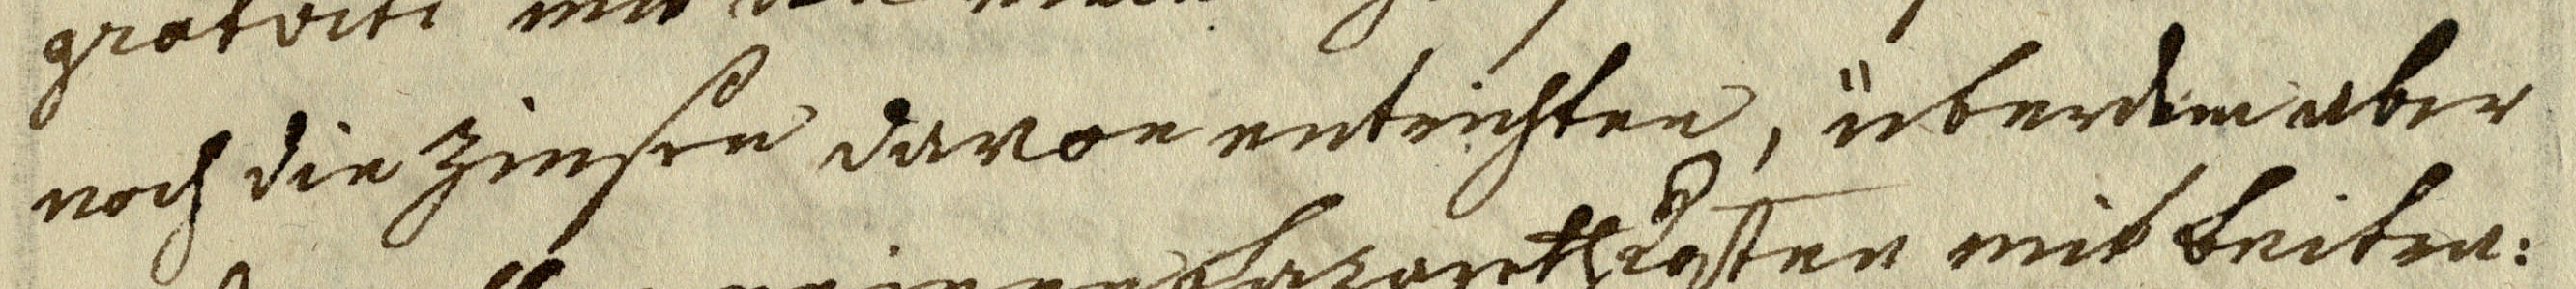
noch die Zinsen davon entrichten, überdem aber
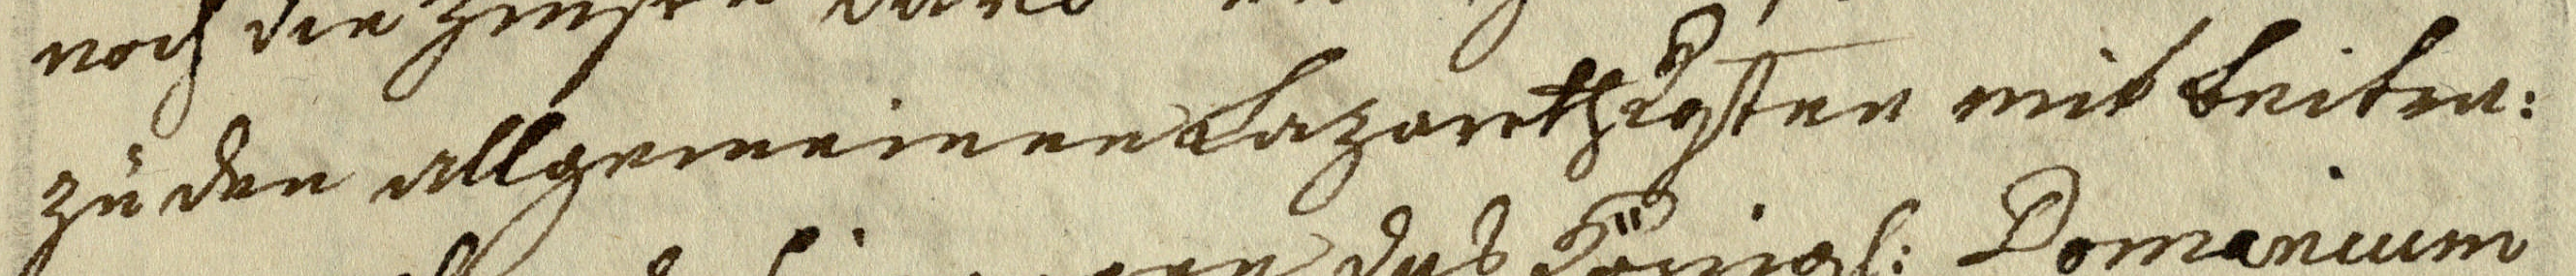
zu den allgemeinen Lazarethkosten mit beitra¬
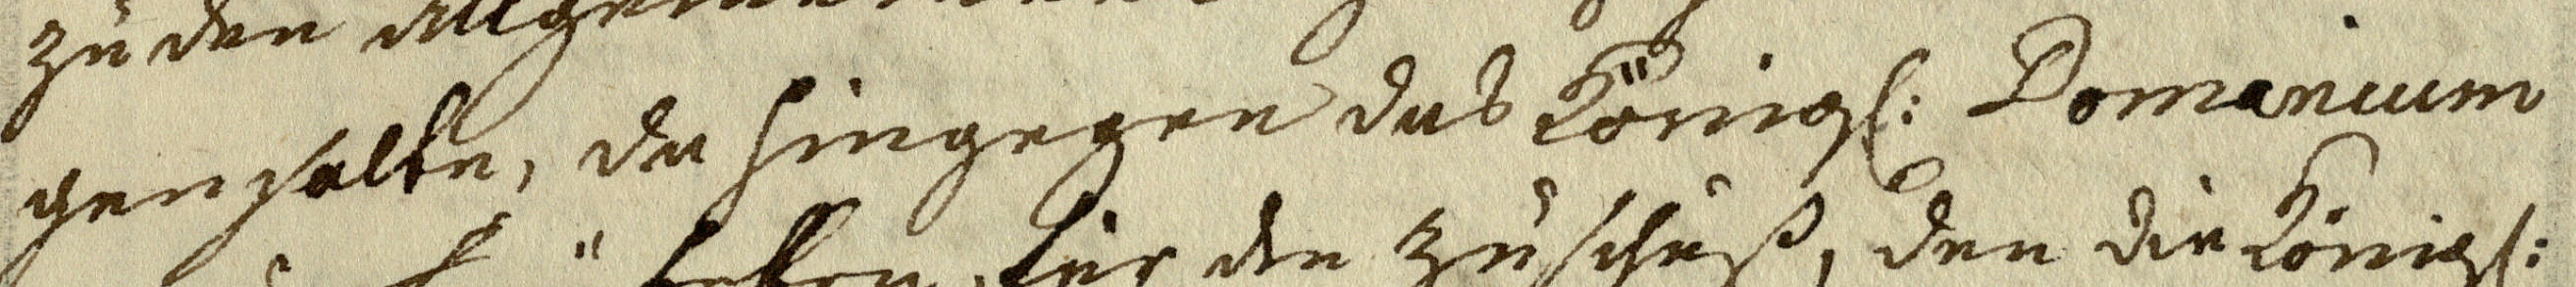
gen solte, da hingegen das Königl. Domanium
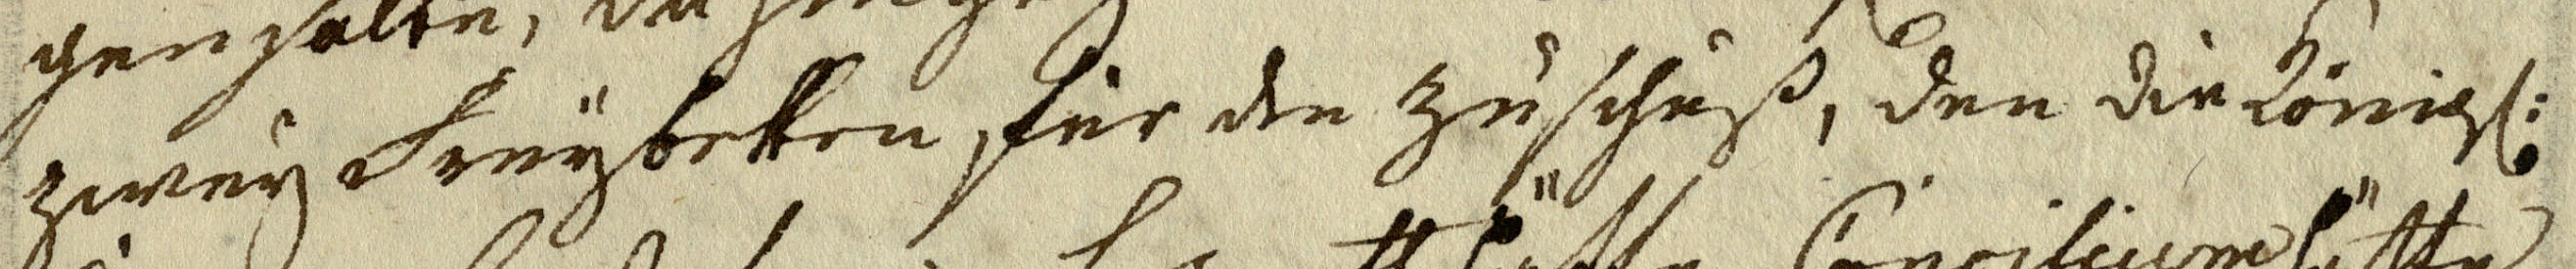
zweÿ Freibetten für den Zuschuß, den die Königl.
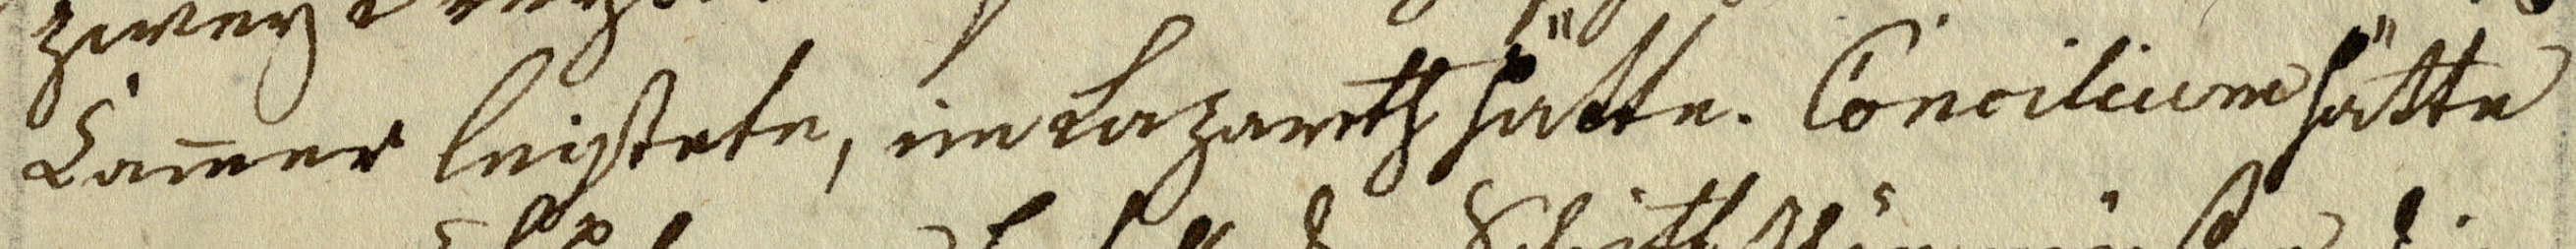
Camer leistete, ein Lazareth hätte. Concilium hätte
